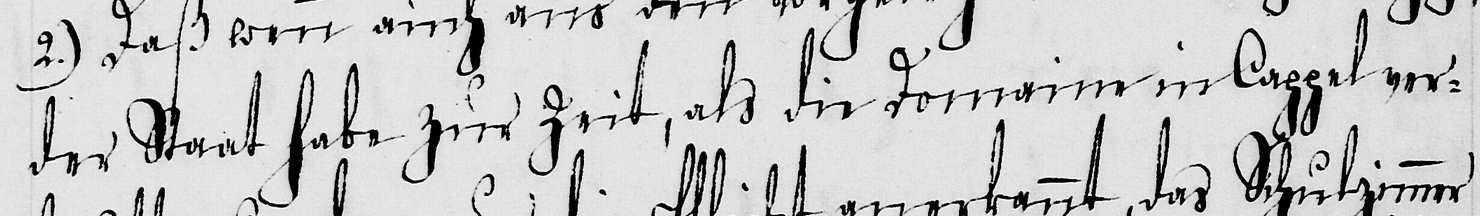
der Staat habe zur Zeit, als die Domaine in Cappel ver¬
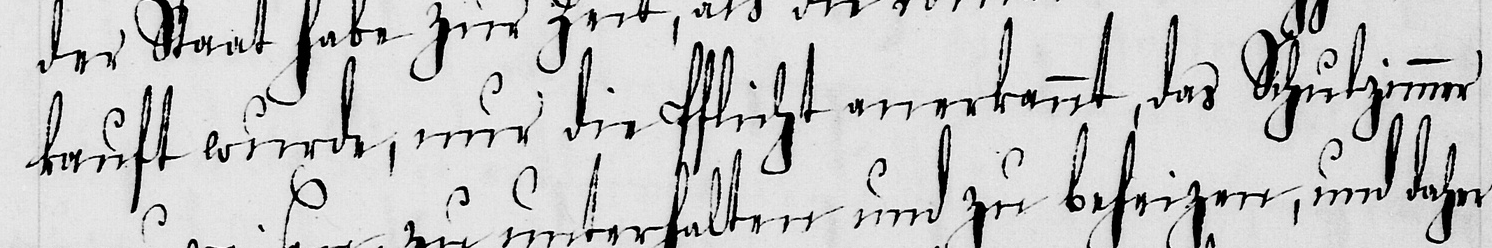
kauft wurde, nur die Pflicht anerkannt, das Schulzim¬
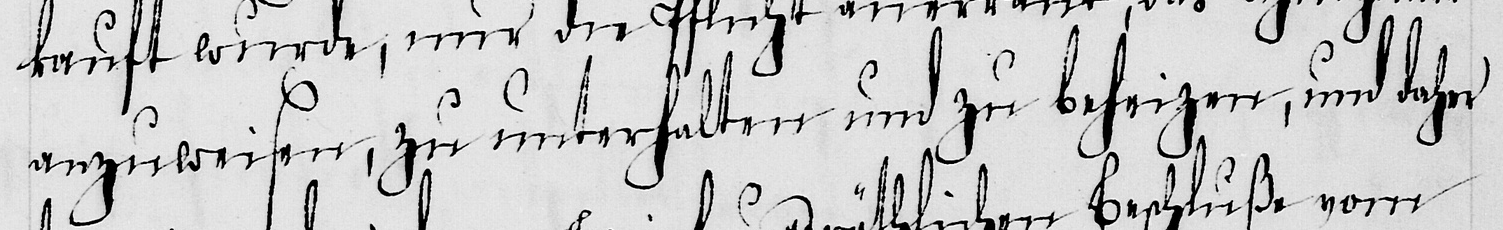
anzuweisen, zu unterhalten und zu beheizen, und daher
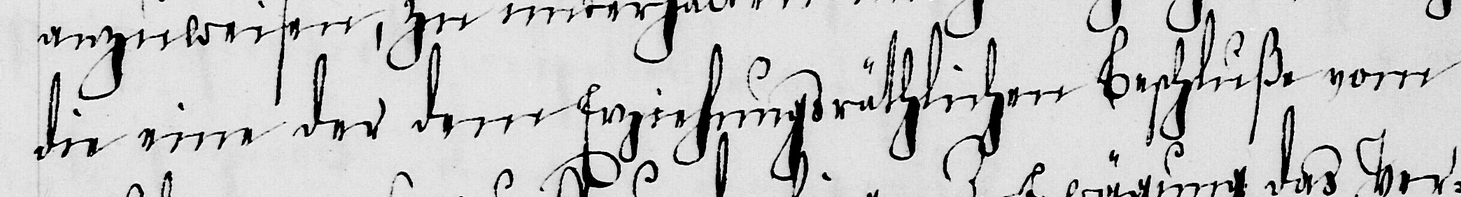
die eine der dem Erziehungsräthlichen Beschluße vom
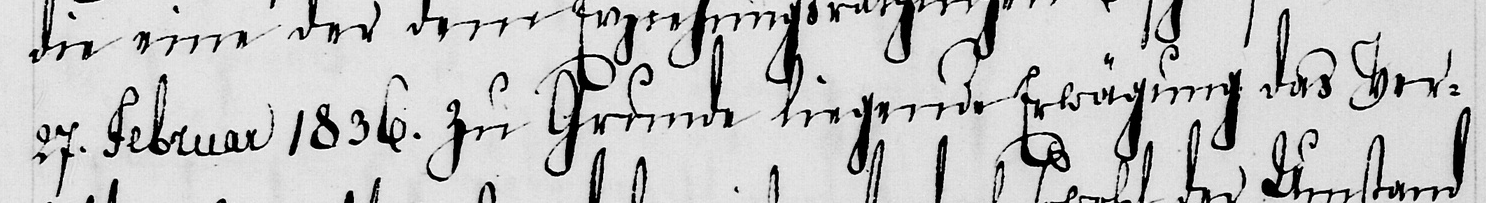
27. Februar 1836. zu Grunde liegende Erwägung das Ver¬
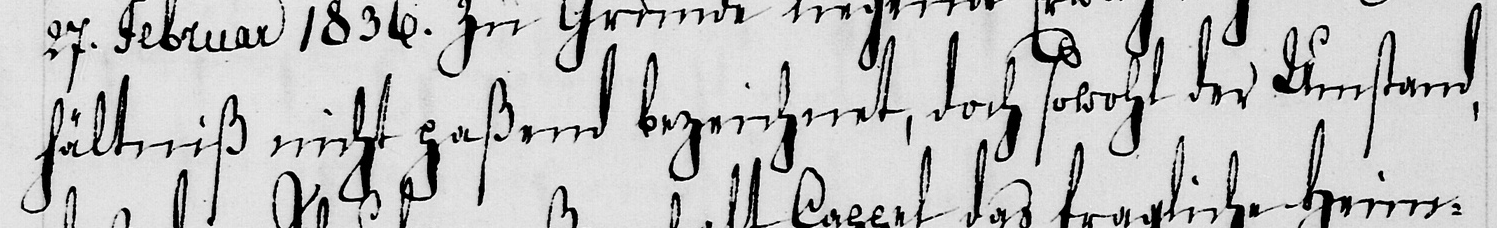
hältniß nicht paßend bezeichnet, doch sowohl der Umstand,
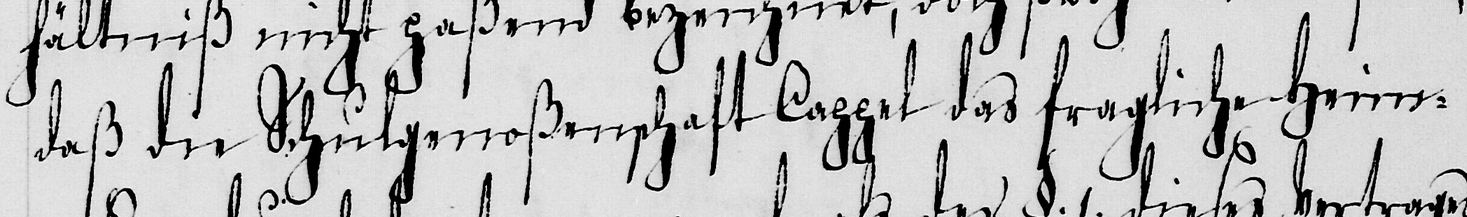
daß die Schulgenoßenschaft Cappel das fragliche Heim¬
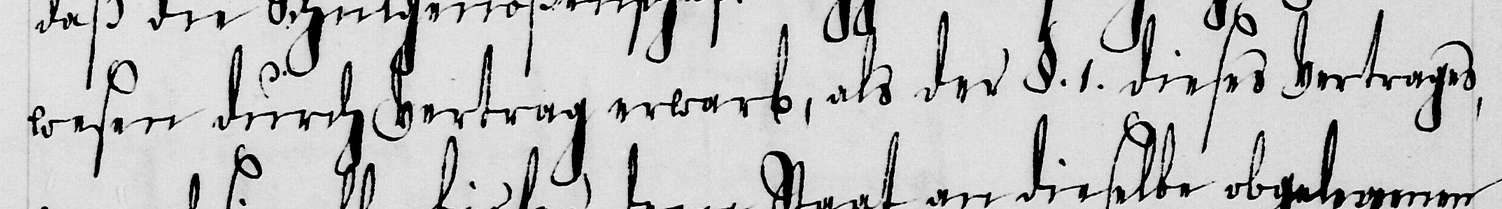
wesen durch Vertrag erwarb, als der §. 1. dieses Vertrages,
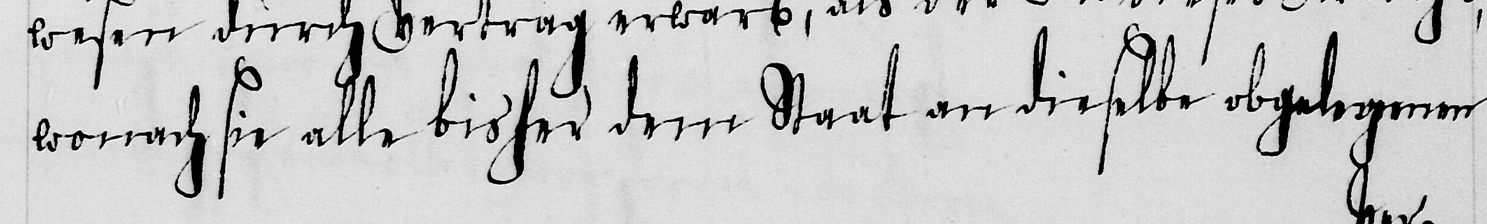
wonach sich alle bisher dem Staat an dieselbe obgelegenen
